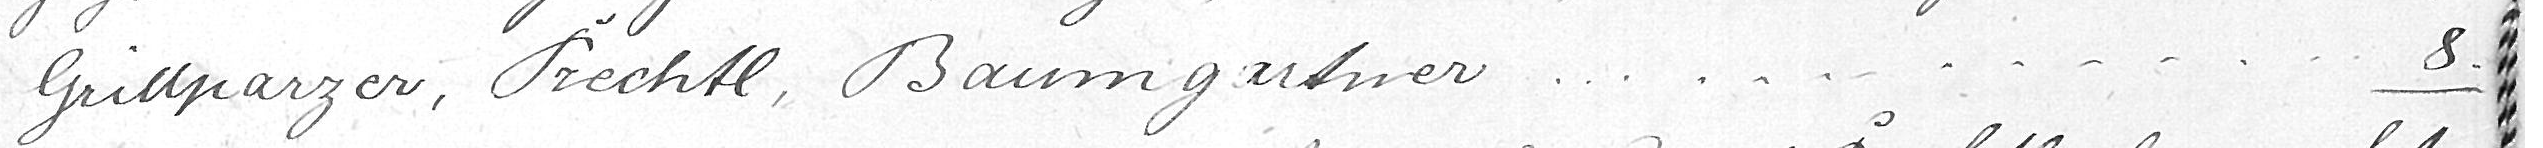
Grillparzer, Prechtl, Baumgartner . . . . . . . . . . . . . 8
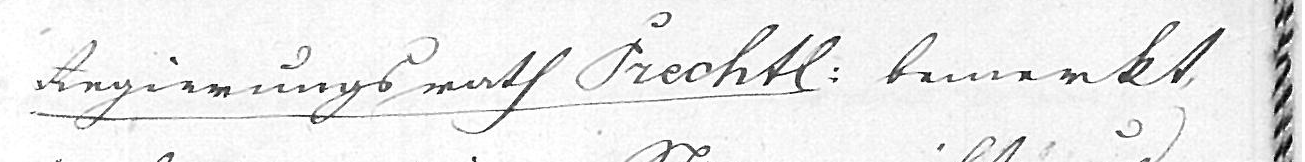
Regierungsrath Prechtl: bemerkt,
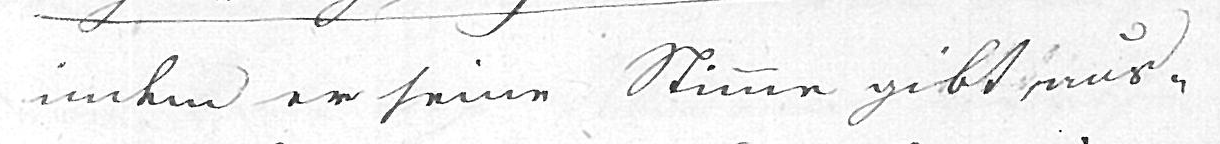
indem er seine Stimme gibt, aus-
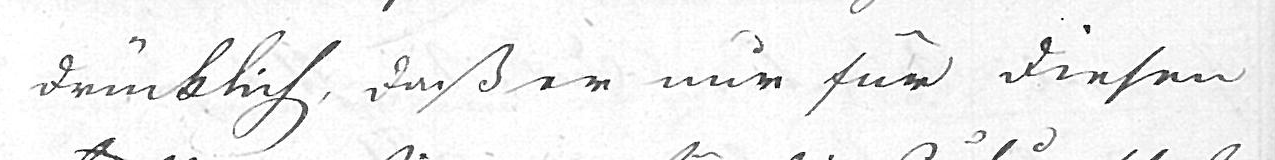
drücklich, daß er nur für diesen
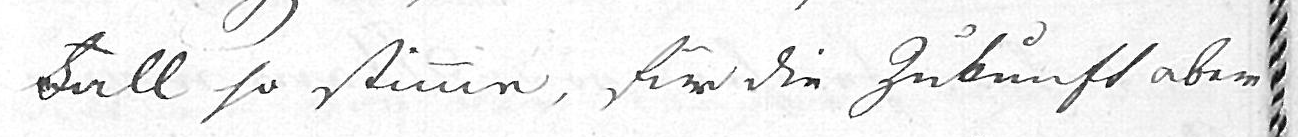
Fall so stimme, für die Zukunft aber
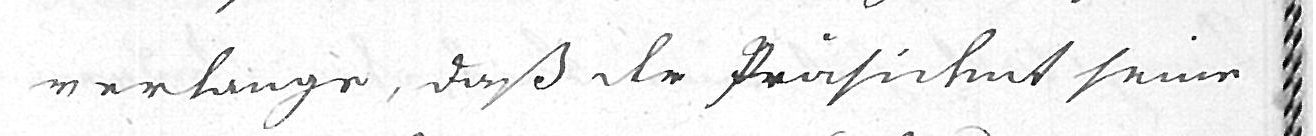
verlange, daß der Präsident seine
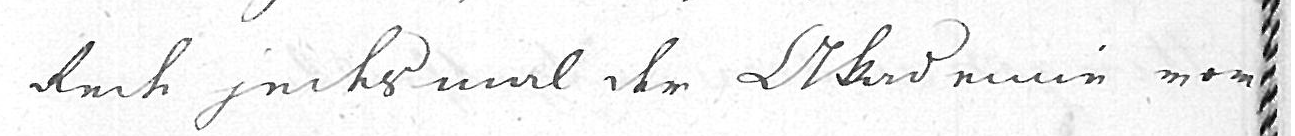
Rede jedesmal der Akademie vor-
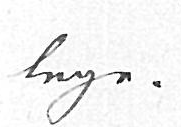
lege.
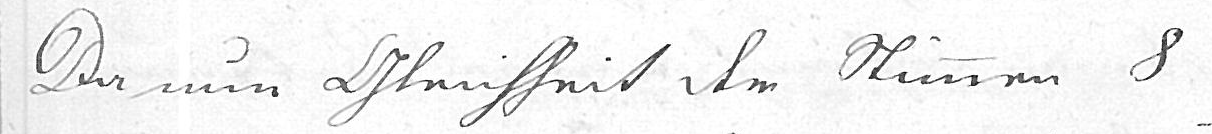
Da nun Gleichheit der Stimmen 8
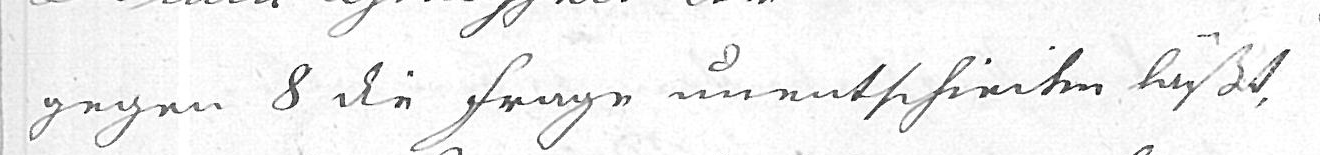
gegen 8 die Frage unentschieden läßt,
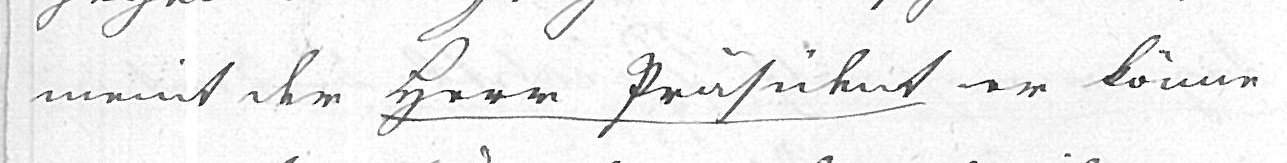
meint der Herr Präsident er könne
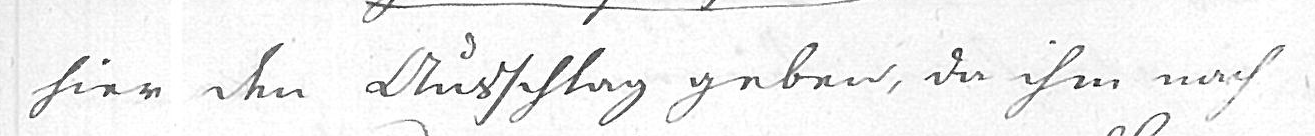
hier den Ausschlag geben, da ihm nach
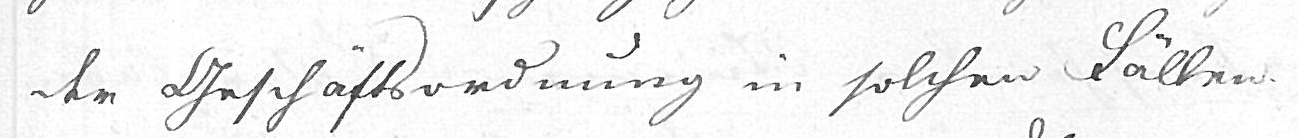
der Geschäftsordnung in solchen Fällen
